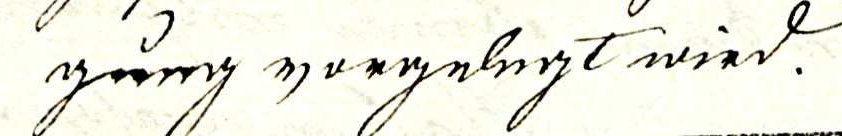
gung vorgelegt wird.
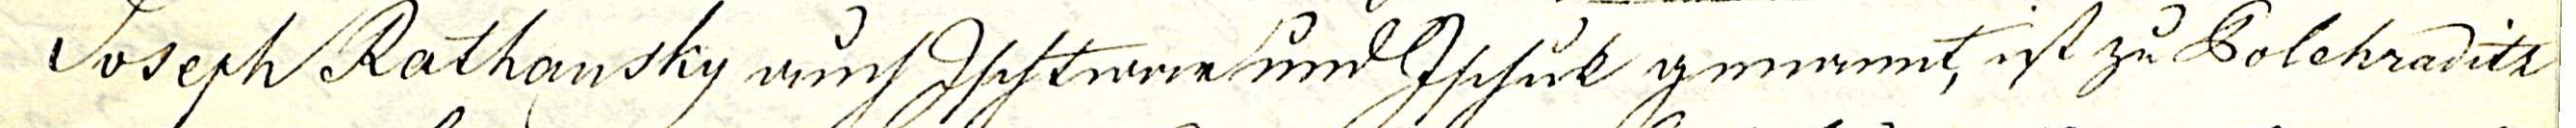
Joseph Rathausky auch Jschtwar und Jschuk genannt, ist zu Polchraditz
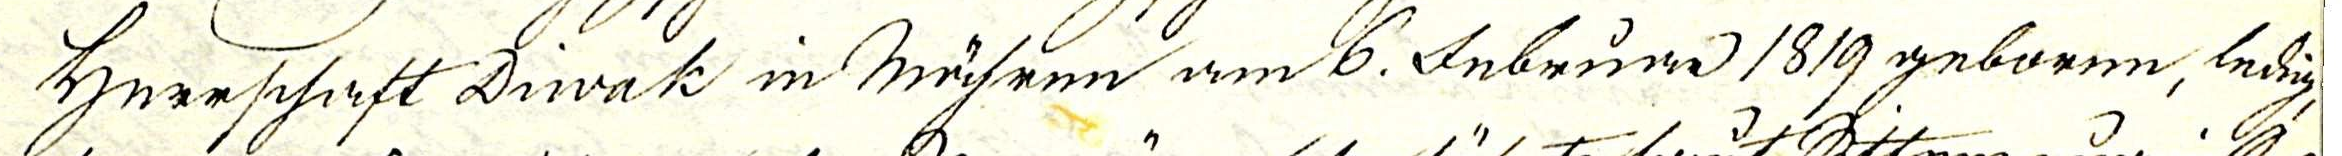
Herrschaft Diwak in Mähren am 6. Februar 1819 geboren, ledig,
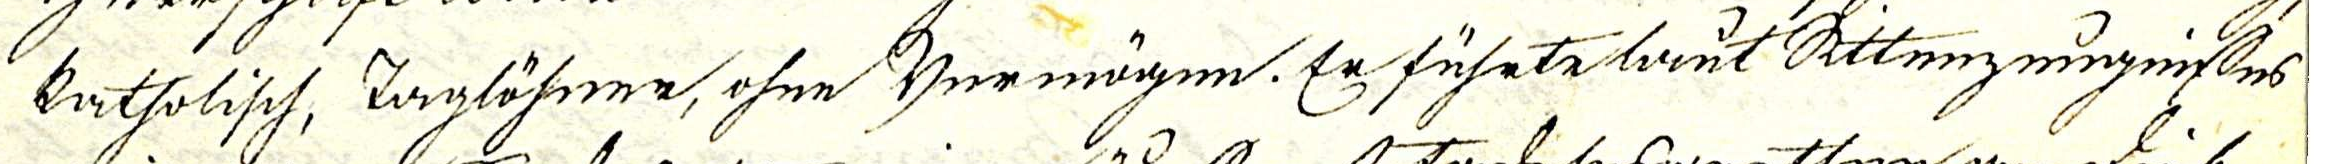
katholisch, Taglöhner, ohne Vermögen. Er führte laut Sittenzeugnißes
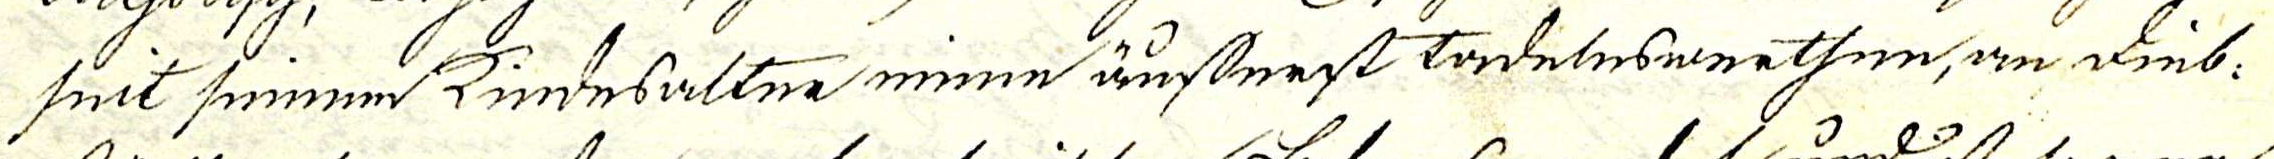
seit seinem Kindesalter einen äußerst tadeleswerthen, an Deib¬
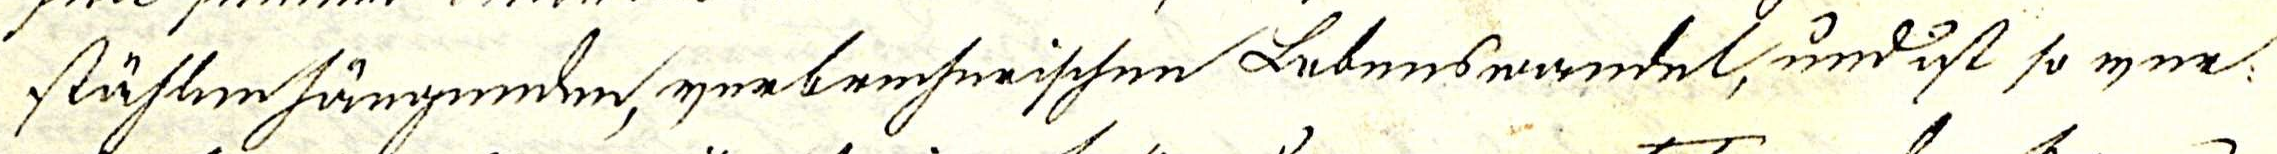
stählen hängenden, verbrecherischen Lebenswandel, und ist so ver¬
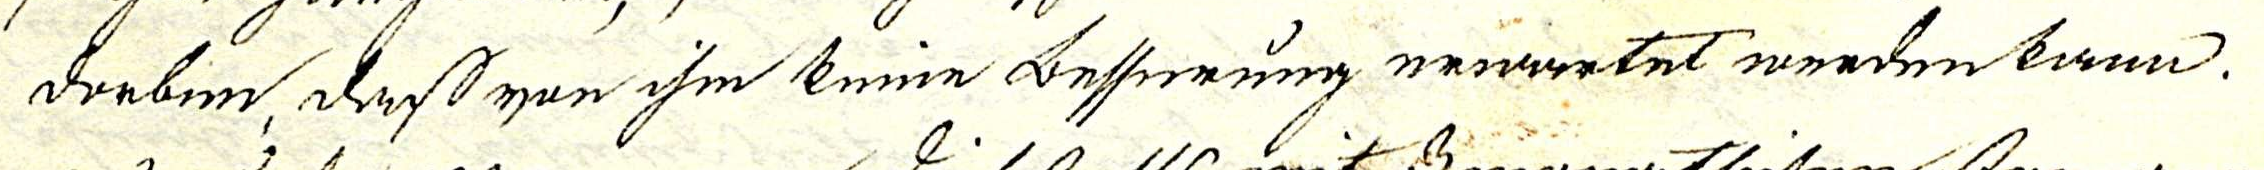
dorben, daß von ihm keine Besserung erwartet werden kann.
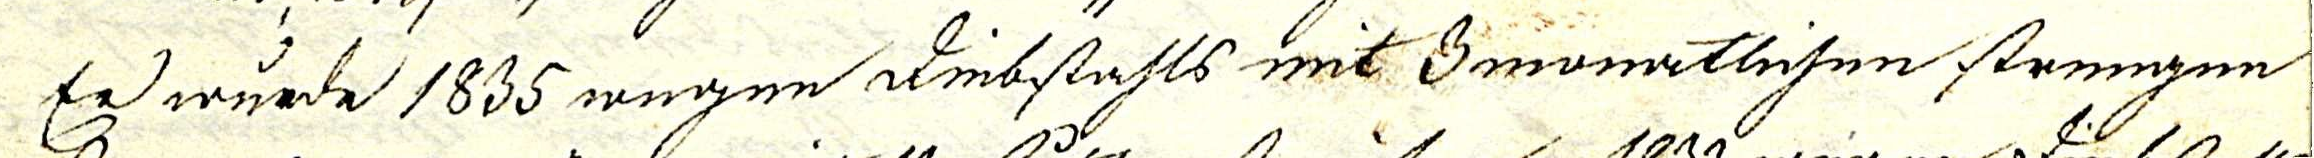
Er wurde 1835 wegen Diebstahls mit 3 monatlichen strengen
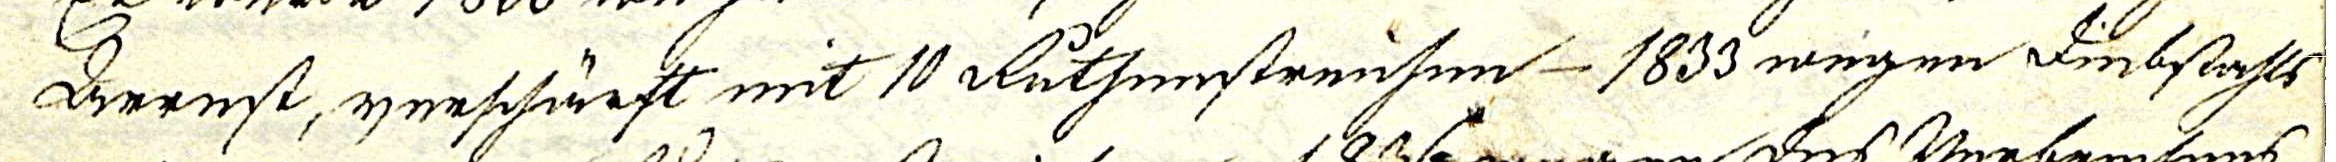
Arrest, verschärft mit 10 Ruthenstreichen – 1833 wegen Diebstahls
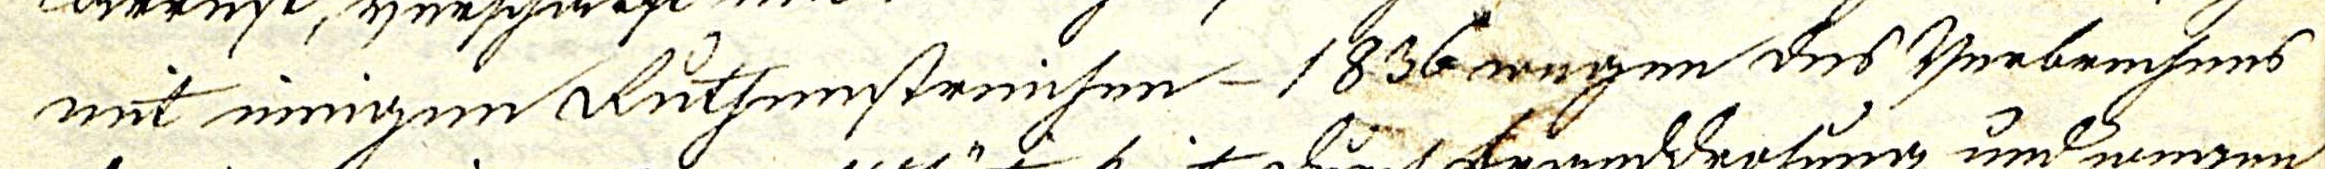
mit einigen Ruthenstreichen – 1836 wegen des Verbrechens
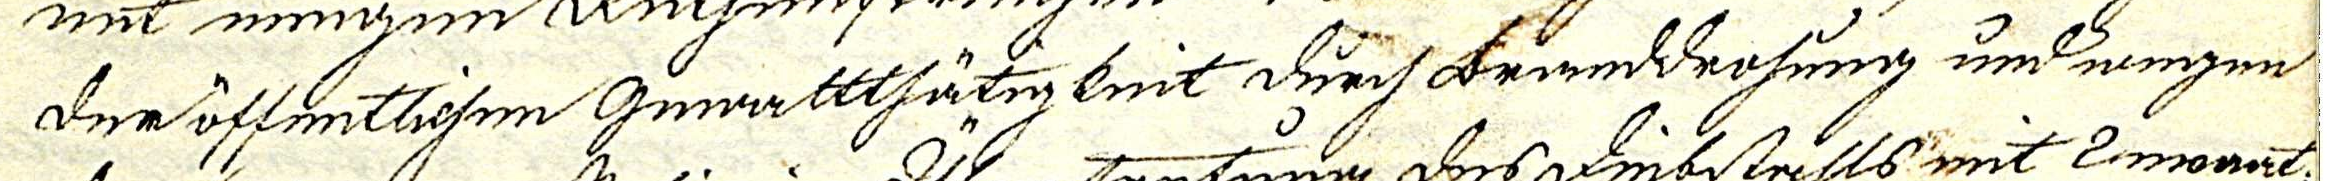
der öffentlichen Gewaltthätigkeit durch Branddrohung und wegen
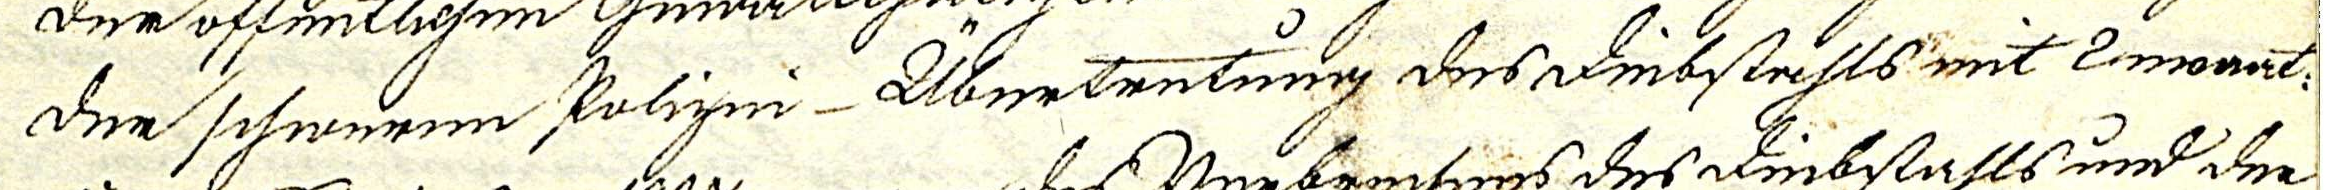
der schweren Polizei-Übertretung des Diebstahls mit 2 monat¬
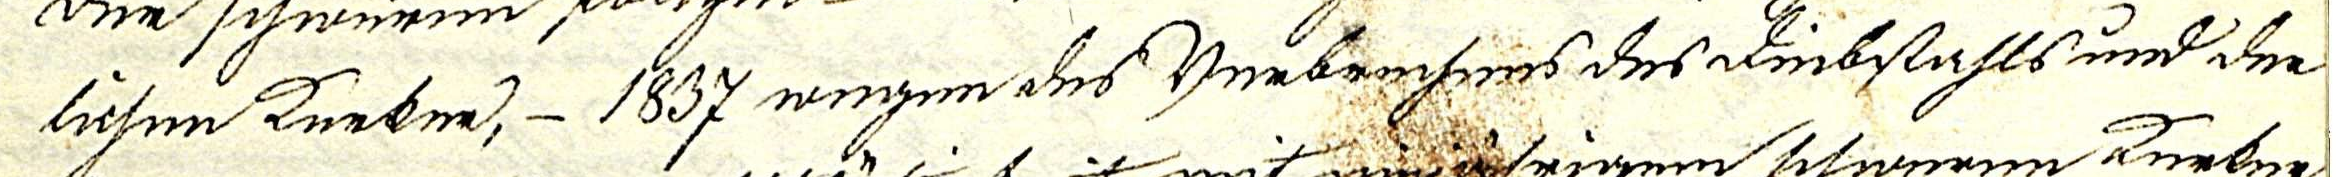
lichen Kerker – 1837 wegen des Verbrechens des Diebstahls und der
